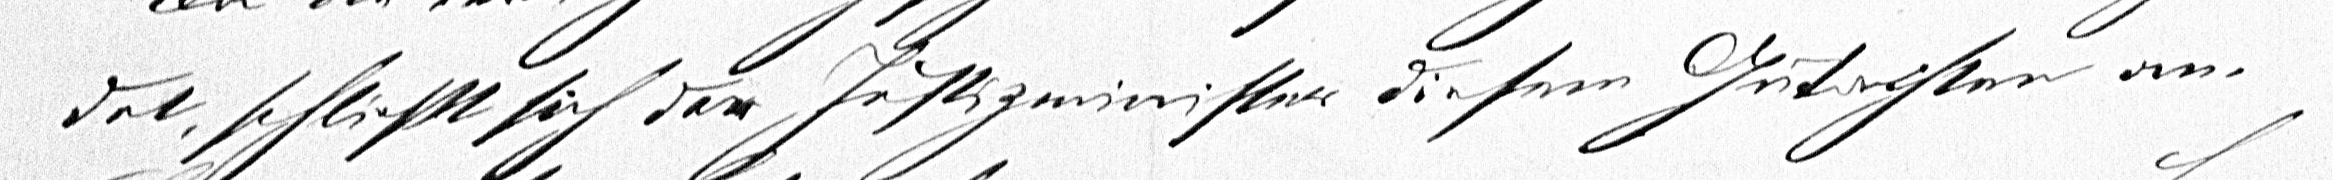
det, schließt sich der Justizminister diesem Gutachten an.
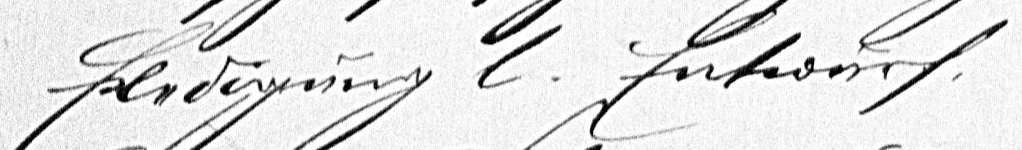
Erledigung C. Entwurf.
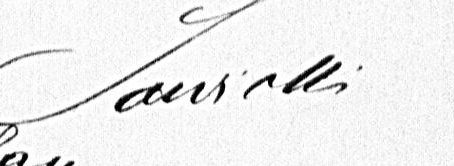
Braun
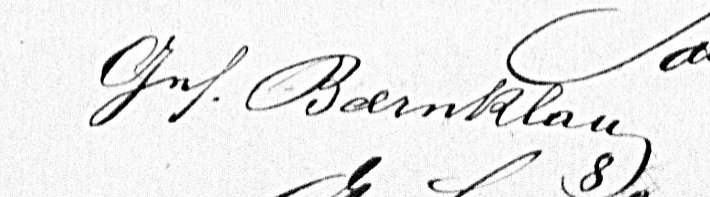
Ges. Boernklan
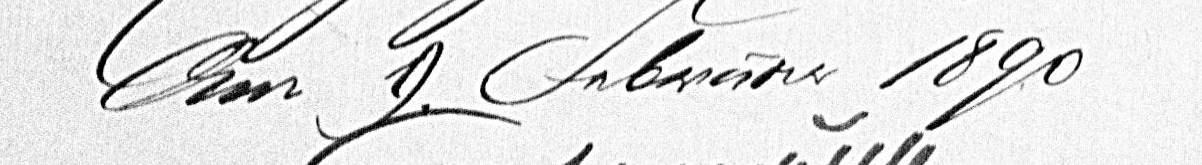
Am 9. Februar 1890
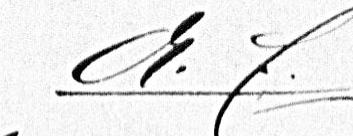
A.E.
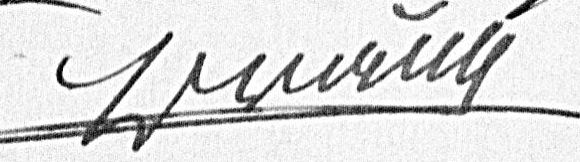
xx
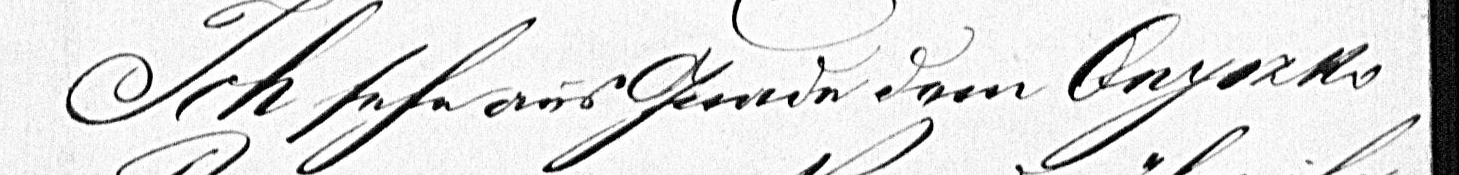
Ich sehe aus Gnade dem Onyszko
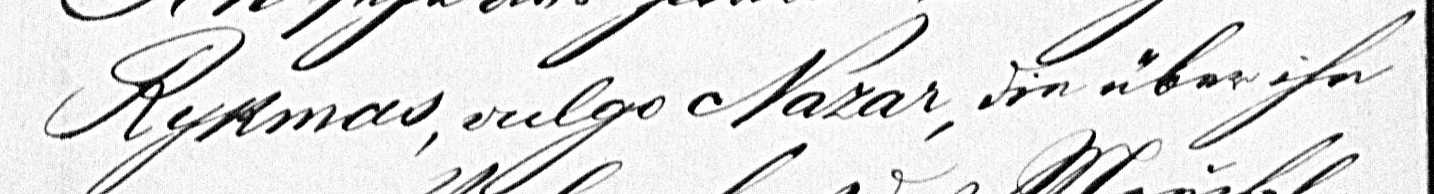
Rykmas, vulgo Nazar, die über ihn
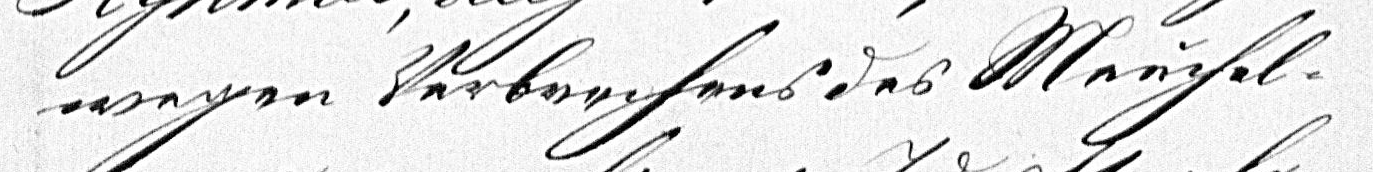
wegen Verbrechens des Meuchel¬
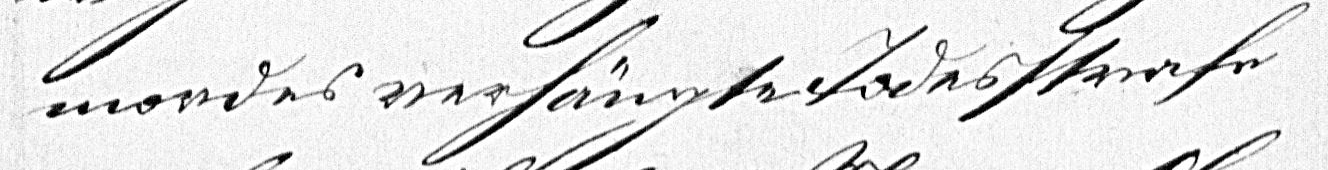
mordes verhängte Todesstrafe
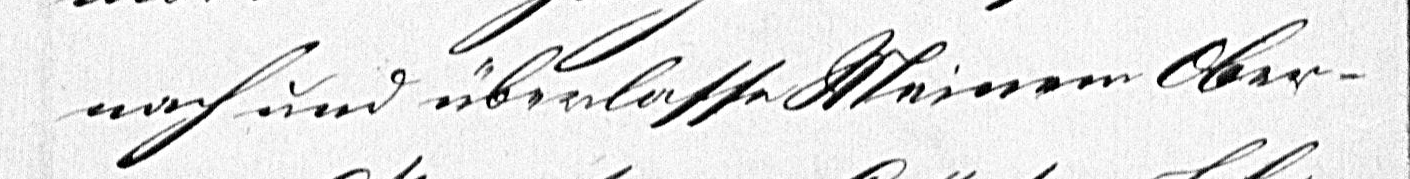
nach und überlasse Meinem Ober¬
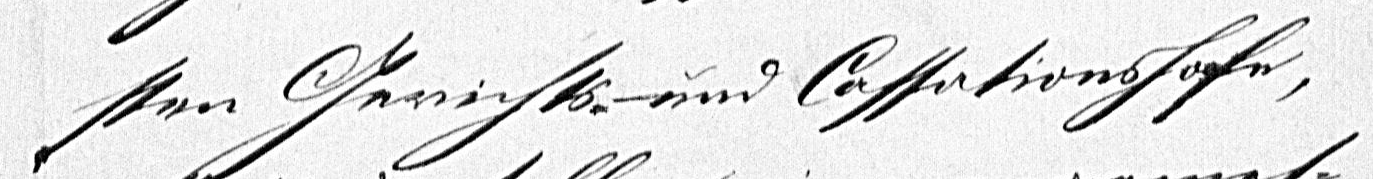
sten Gerichts- und Cassationshofe,
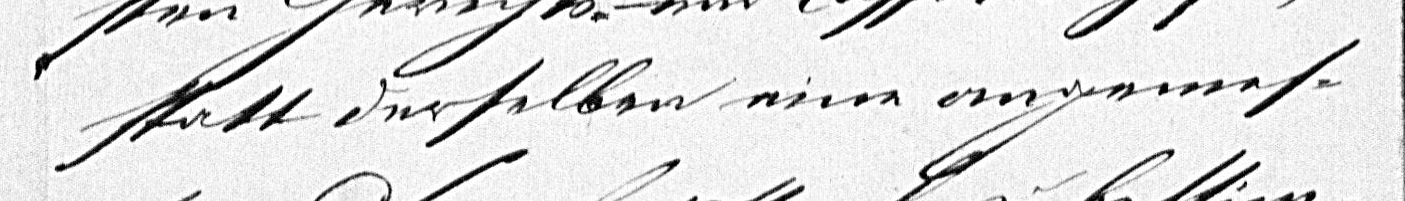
statt derselben eine angemes¬
